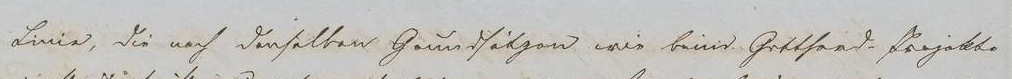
Linie, die nach denselben Grundsätzen wie beim Gotthard-Projekte
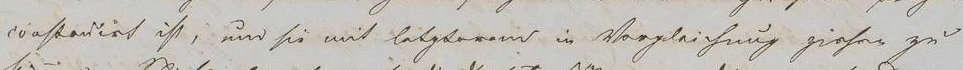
construirt ist, um sie mit letzterem in Vergleichung ziehen zu
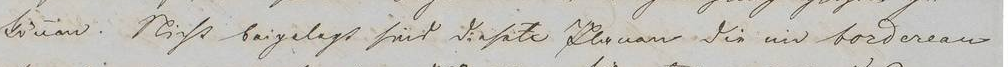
können. Nicht beigelegt sind dieseln Planen die im Bordereau
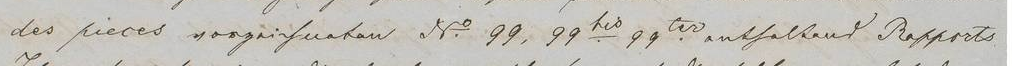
des pieces verzeichneten No 99, 99bis 99ter enthaltend Rapports
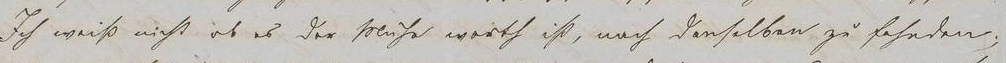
Ich weiß nicht ob es der Mühe werth ist, nach denselben zu fahnden;
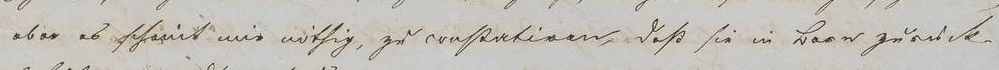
aber es scheint mir nöthig, zu constatiren, daß sie in Bern zurück-
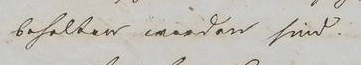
behalten worden sind.
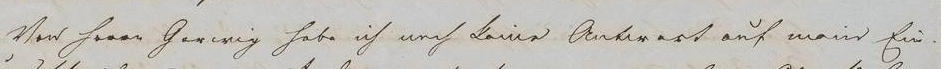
Von Herrn Gerwig habe ich noch keine Antwort auf mein Ein-
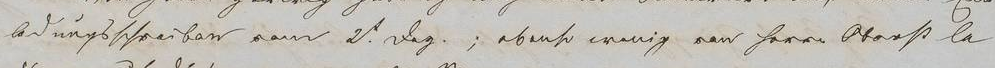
ladungsschreiben vom 2t Dez.; ebenso wenig von Herrn Oberst la
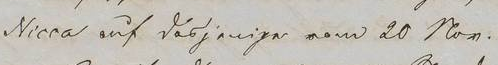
Nicca auf dasjenige vom 20 Nov.
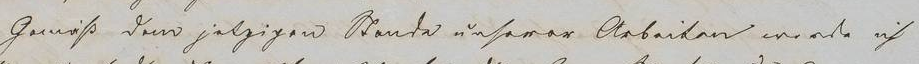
Gemäß dem jetzigen Stande unserer Arbeiten werde ich
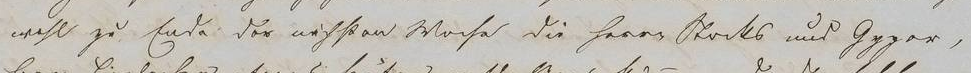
wohl zu Ende der nächsten Woche die Herrn Stocks und Gyger,
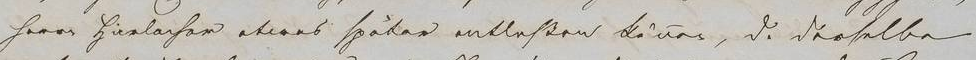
Herrn Harlacher etwas später entlaßen können, da derselbe
